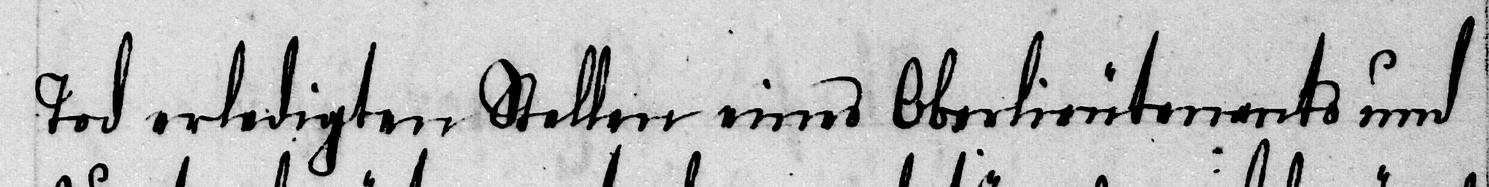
Tod erledigten Stellen eines Oberlieutenants und
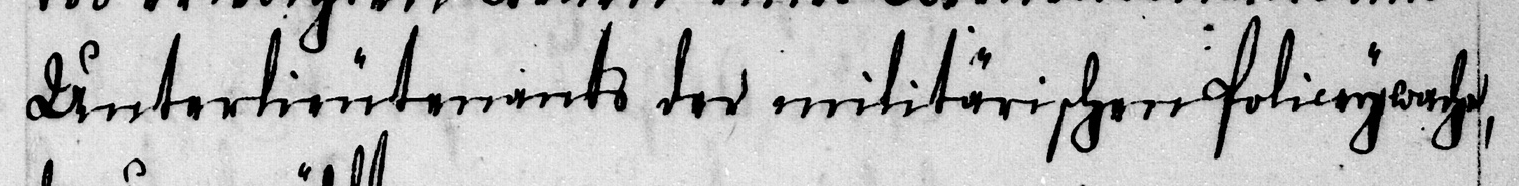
Unterlieutenants der militärischen Policeywache,
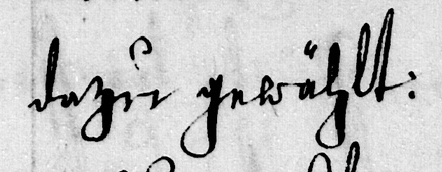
dazu gewählt:
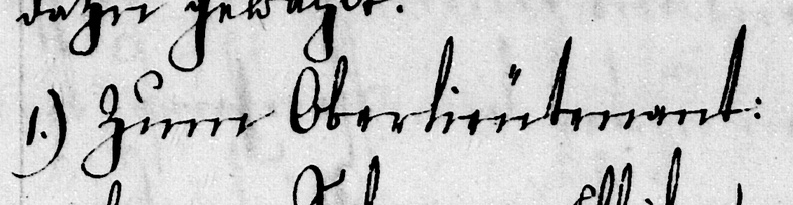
1.) Zum Oberlieutenant:
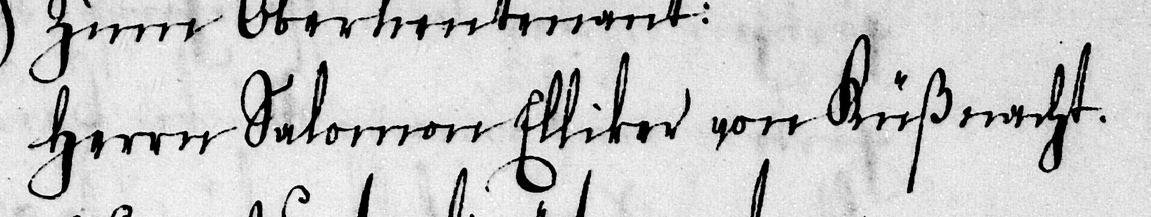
Herrn Salomon Elliker von Küßnacht.
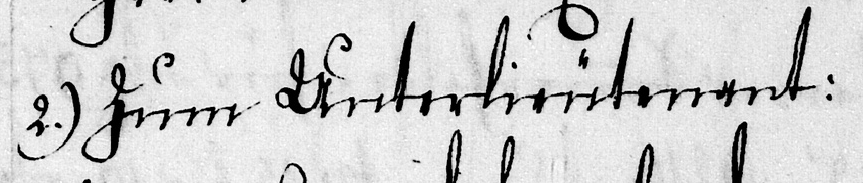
2.) Zum Unterlieutenant:
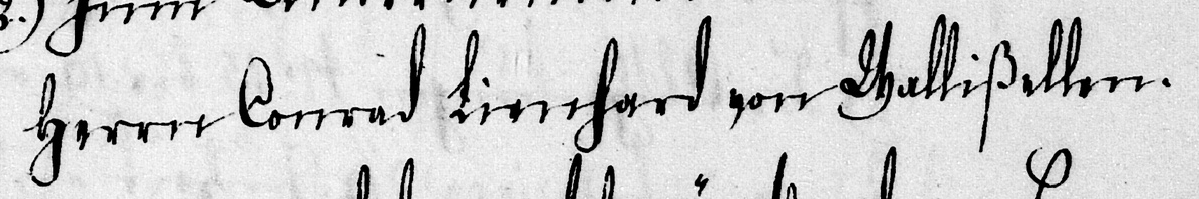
Herrn Conrad Lienhard von Wallißellen.
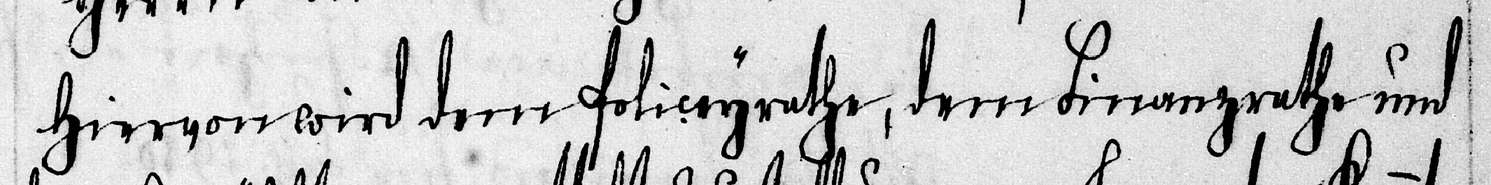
Hiervon wird dem Policeyrathe, dem Finanzrathe und
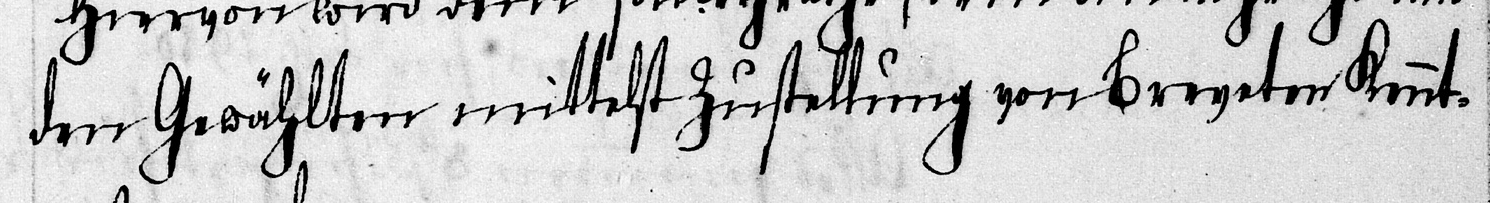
den Gewählten mittelst Zustellung von Breveten Kennt¬
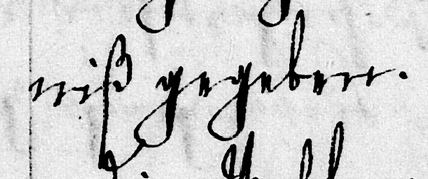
niß gegeben.
